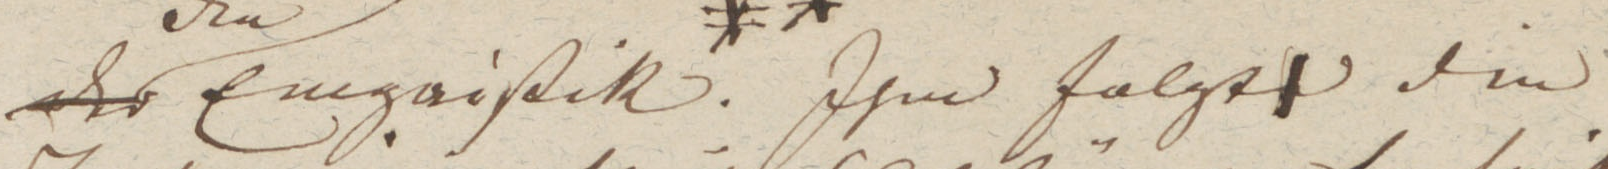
die Empaistik. % % Ihm folgte die
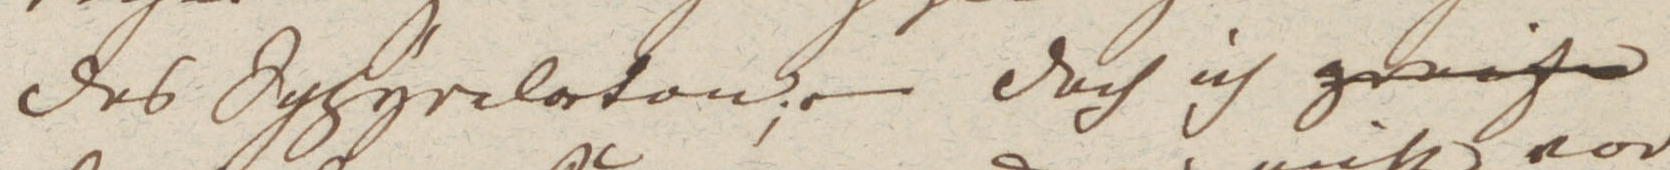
des Sphyrelaton; – Doch ich greife
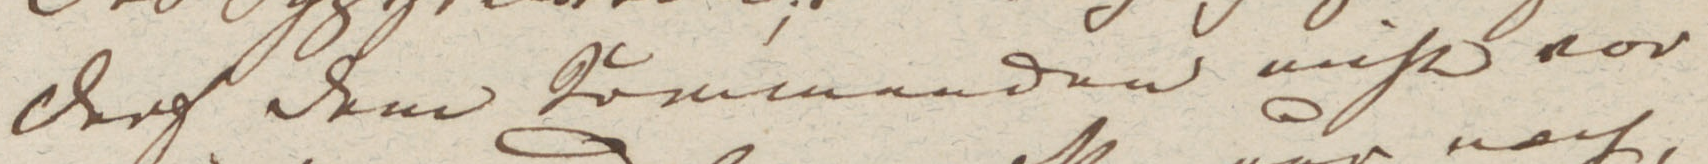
darf dem Kommenden nicht vor-
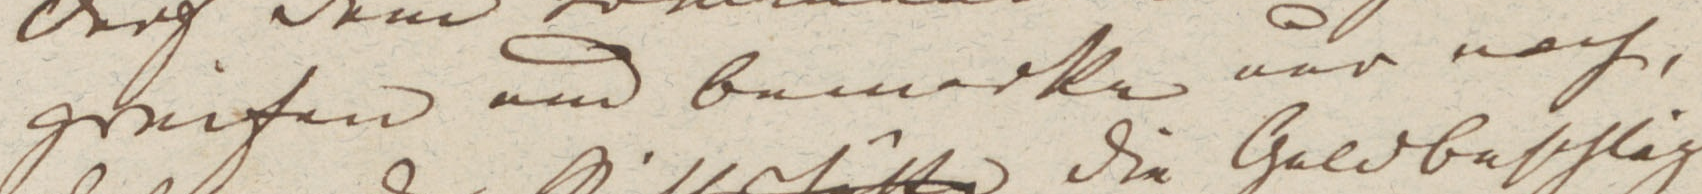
greifen und bemerke nur noch,
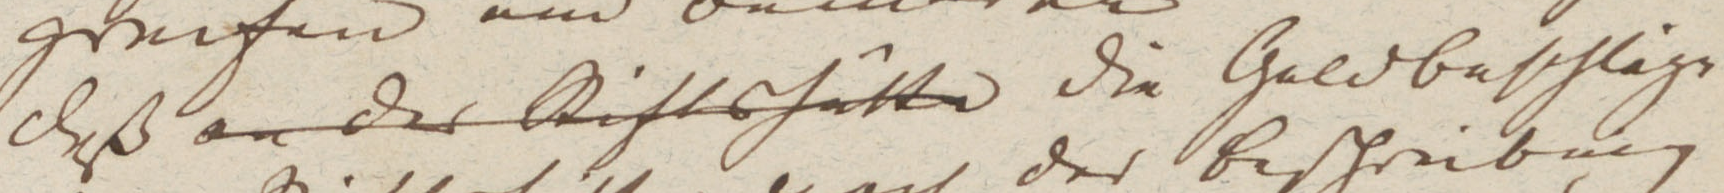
dass an der Stiftshütte die Goldbeschläge
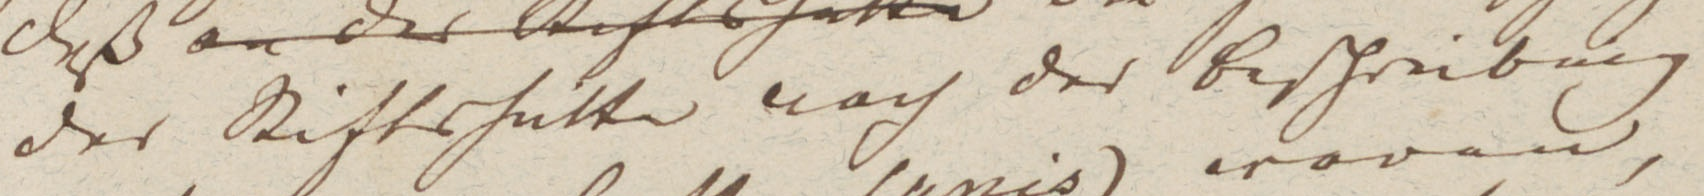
der Stiftshütte nach der Beschreibung
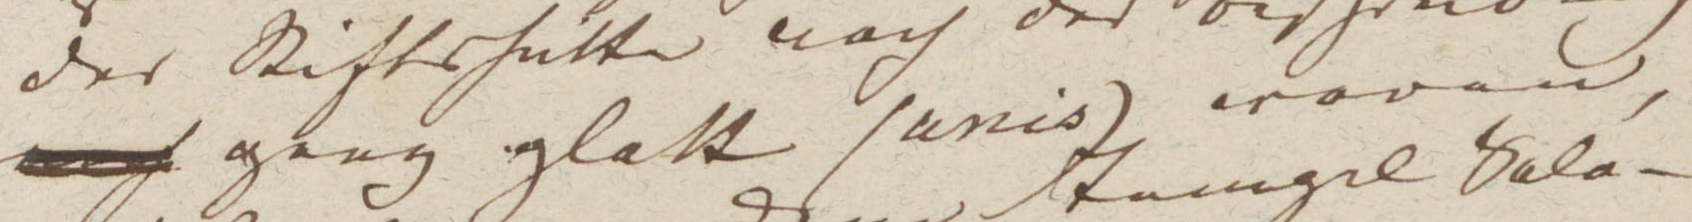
noch ganz glatt (unis) waren,
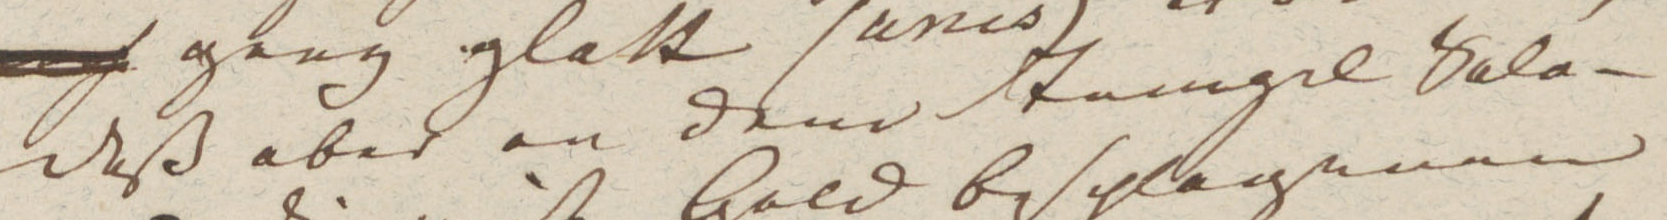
dass aber an dem Tempel Salo-
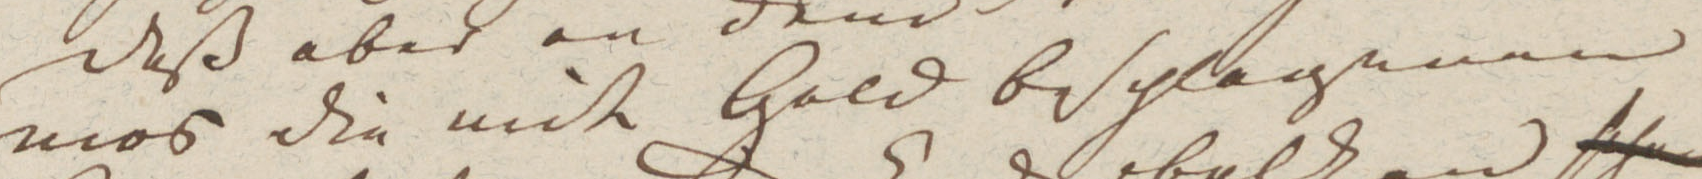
mos die mit Gold beschlagenen
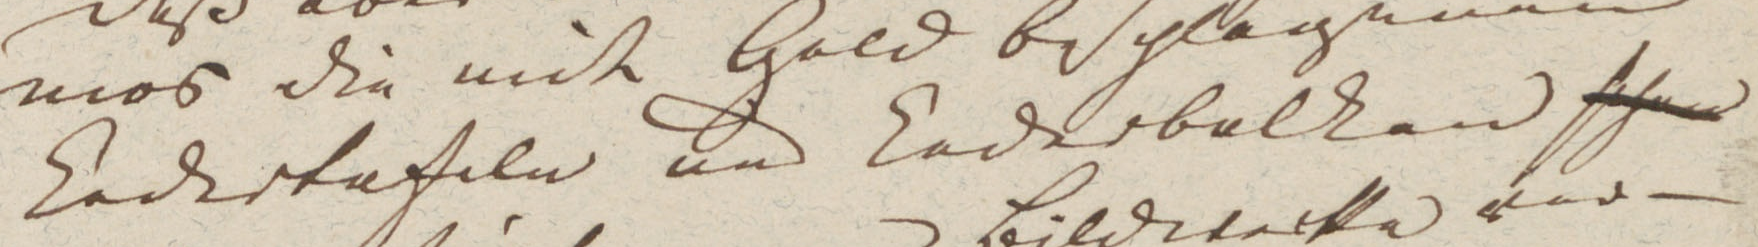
Cedertafeln und Cederbalken schon
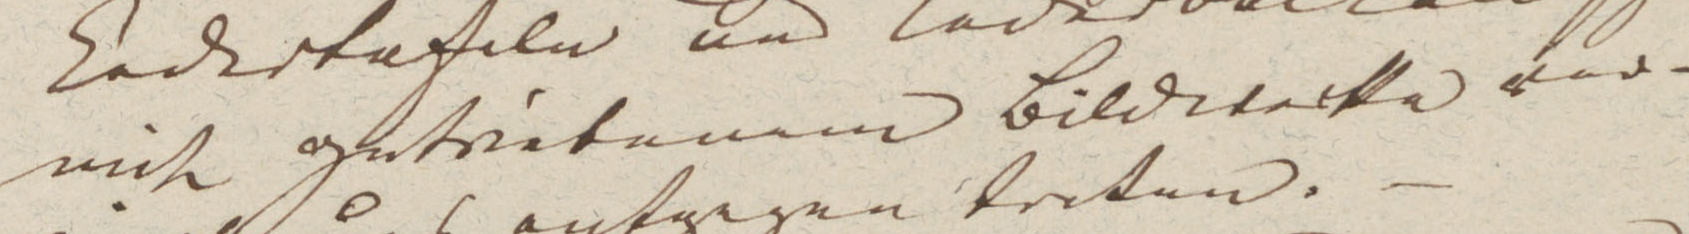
mit getriebenem Bildwerke ver-
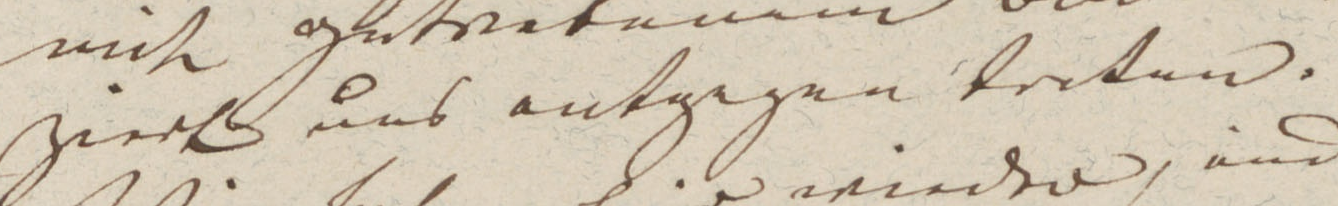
ziert uns entgegen treten.
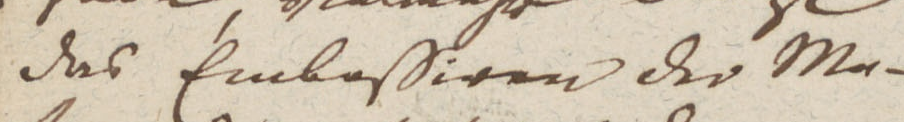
das Embossiren der Me-
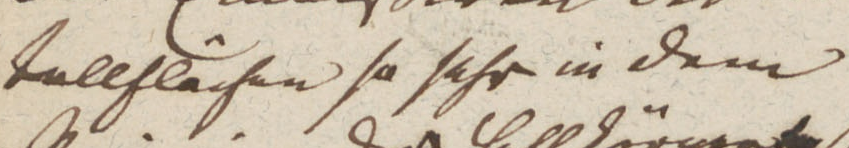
tallflächen so sehr in dem
